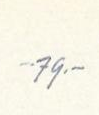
79
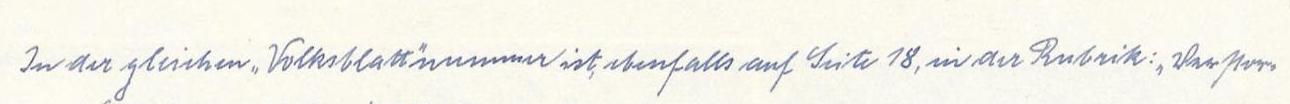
In der gleichen „Volksblatt"nummer ist ebenfalls auf Seite 18, in der Rubrik: „Verstor
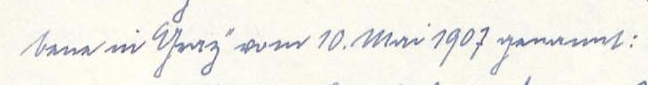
bene in Graz" vom 10. Mai 1907 genannt:
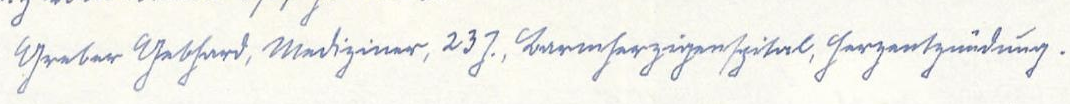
Greber Gebhard, Mediziner, 23 J. Barmherzigenspital, Herzentzündung-
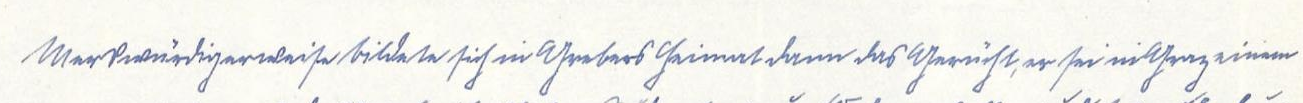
Merkwürdigerweise bildete sich in Grebers Heimat dann das Gerücht, er sei in Graz einem
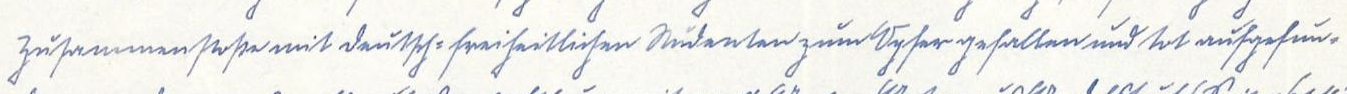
Zusammenstoße mit deutsch- freiheitlichen Studenten zum Opfer gefalen und tot aufgefun-
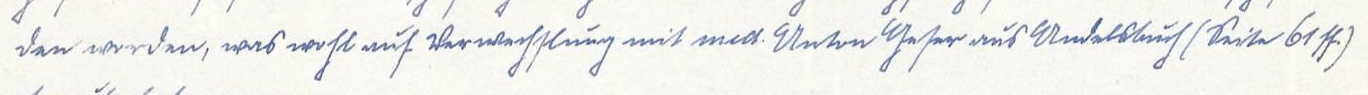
den worden, was wohl auf Verwechslung mit med. Anton Geser aus Andelsbuch (Seite 61 ff.)
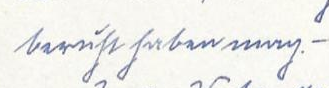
beruht haben mag.
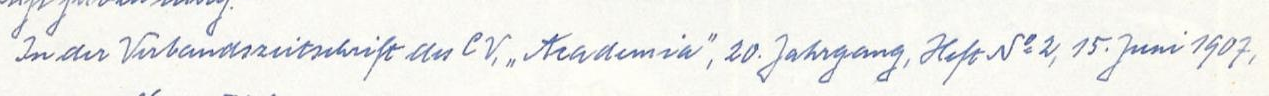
In der Verbandszeitschift des CV „Academia", 20. Jahrgang, Heft. No 2, 15. Juni 1907,
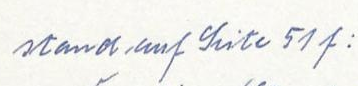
stand auf Seite 51 f:
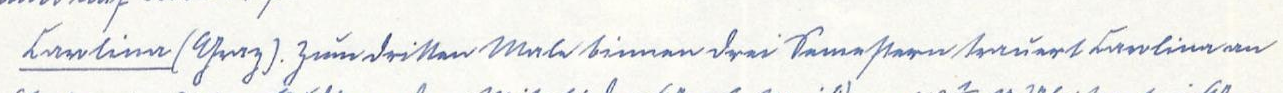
Carolina (Graz). Zum dritten Male binnen drei Semestern trauert Carolina an
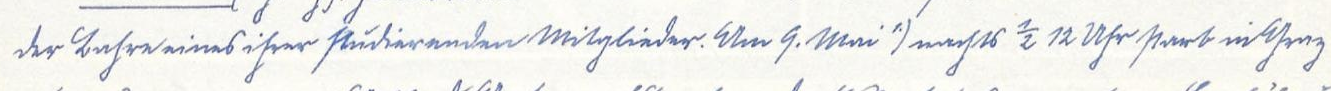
der Bahre eines ihrer studierenden Mitglieder. Am 9. Mai 1) nachts 1/2 12 Uhr starb in Graz
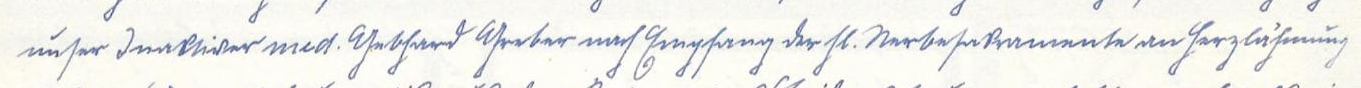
unser Inaktiver med. Gebhard Greber nach Enpfang der hl. Sterbesakamente an Herzlähmung
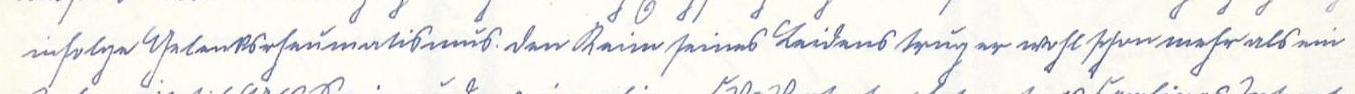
infolge Gelenksrheumatismus. Den Keim seines Leidens trug er wohl schon mehr als ein
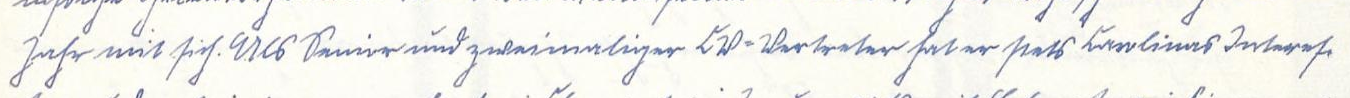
Jahr mit sich. Als Senior und zweimaliger CV-Vertreter hat er stets Carolinas Interes-
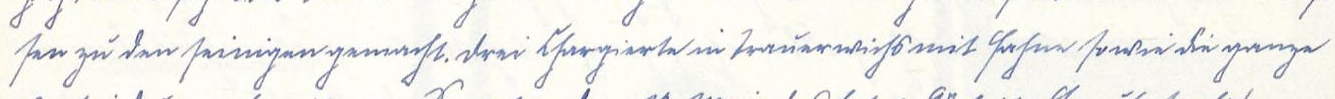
sen zu den seinigen gemacht. Drei Chargierte in Trauerwichs mit Fahne sowie die ganze
